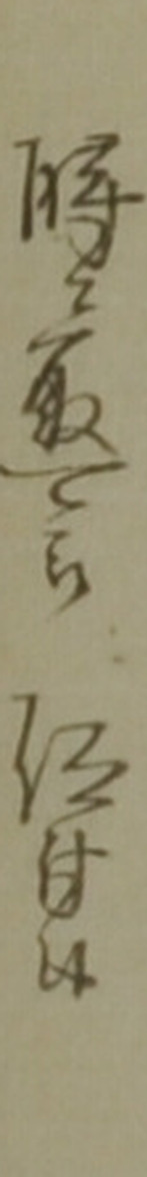時ニ取可被仰付候

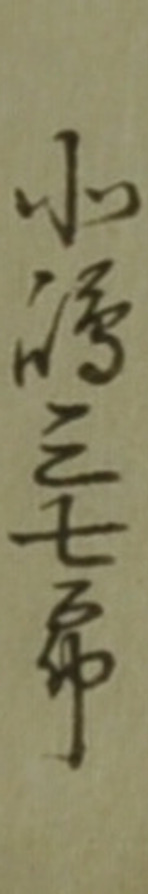北嶋三七郎
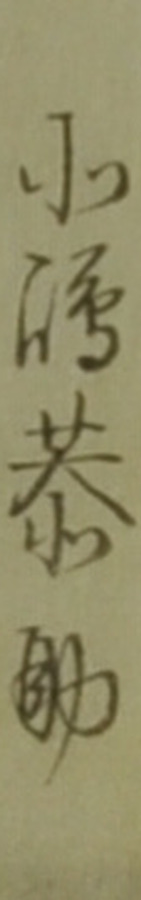北嶋恭助
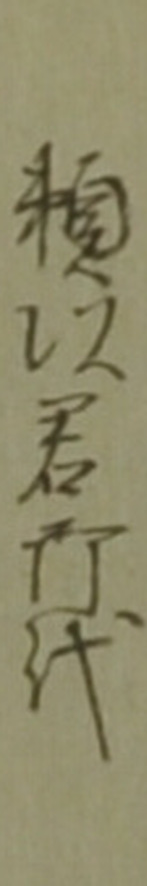頼以君御代
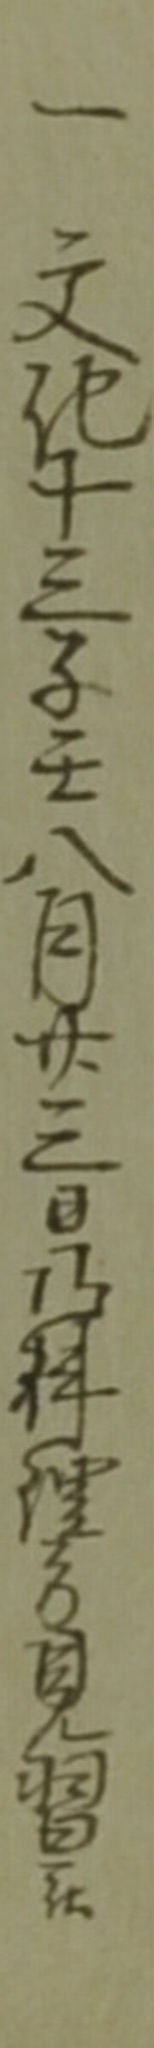一文化十三子閏八月廿三日御料理方見習被
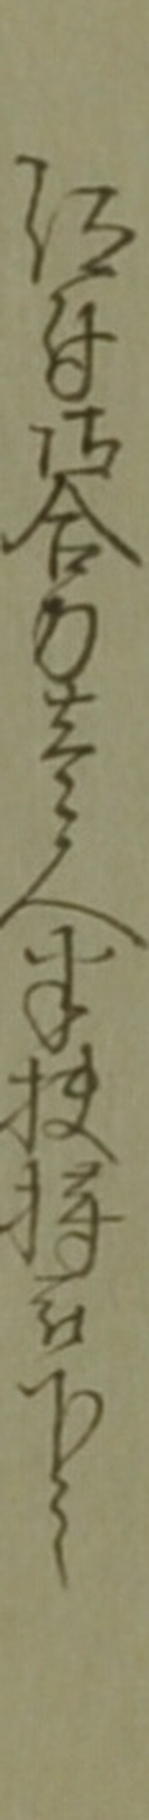仰付御合力壱人半扶持被下之
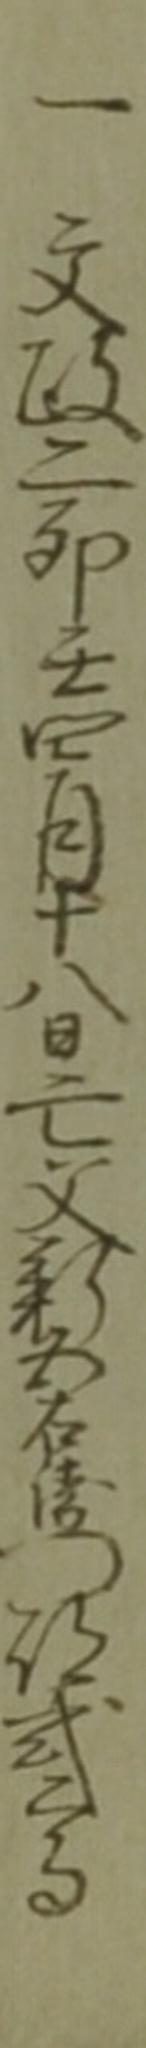一文政二卯閏四月十八日亡父新五右衛門跡式高
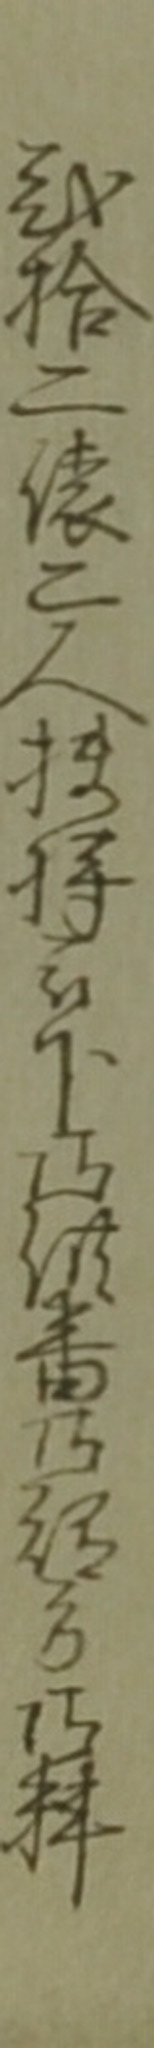弐拾二俵二人扶持被下御供番御賄方御料
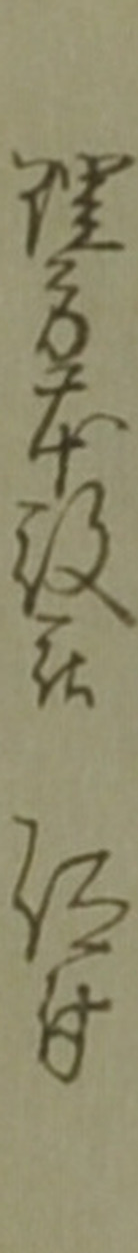理方本役被仰付
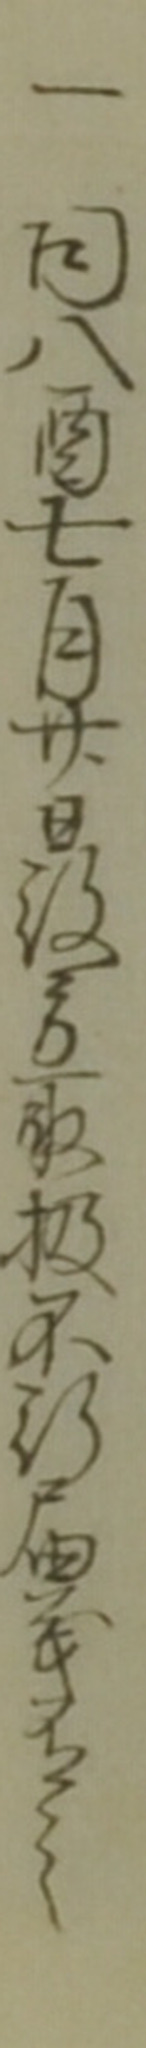一同八酉七月廿日役方取扱不行届義有之
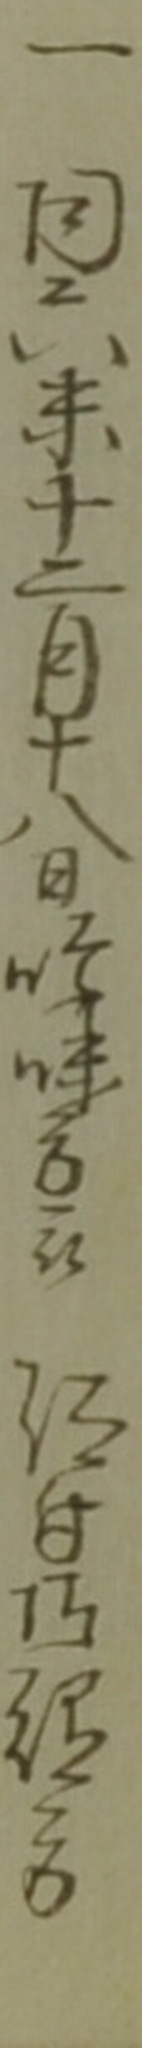一同六未十二月十八日吟味被仰付御賄方
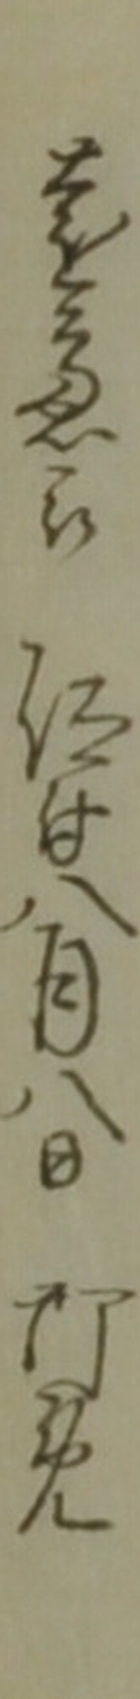遠慮被仰付八月八日御免
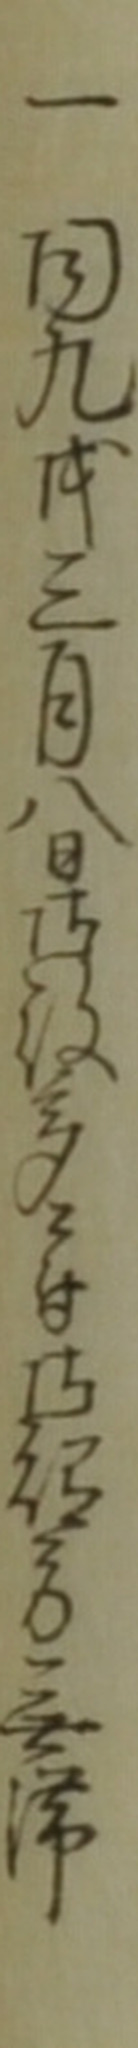一同九戌三月八日御役多ニ付御賄方無滞

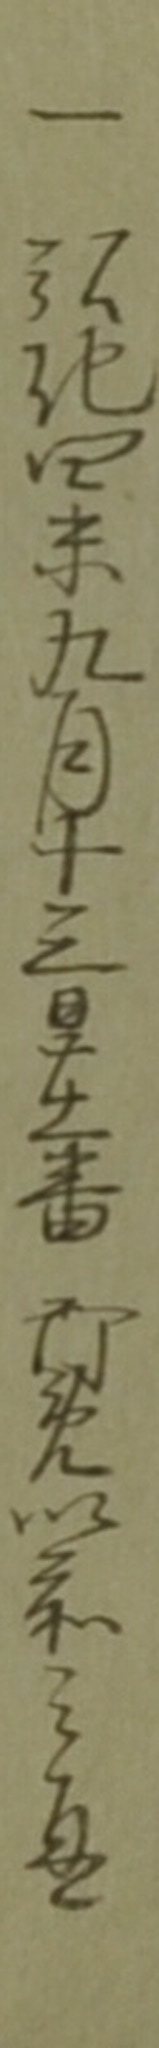一弘化四未九月十三日在番御免以前之通
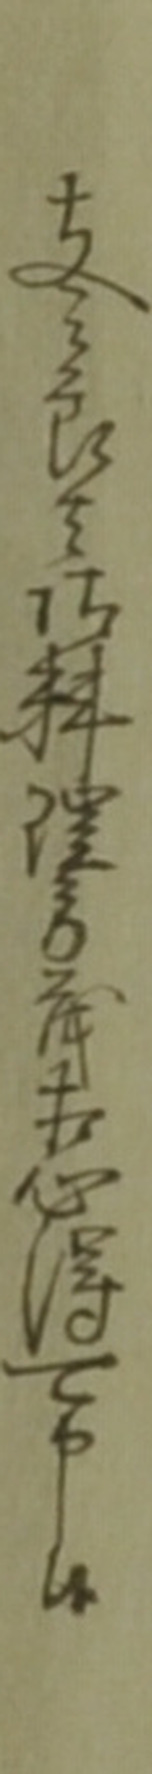支部之節者御料理方茂相心得可申候
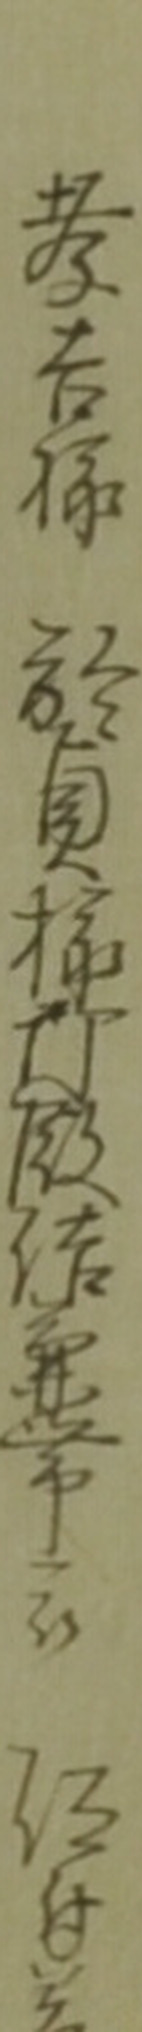孝吉様於貞様御殿詰兼帯被仰付差
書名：無足諸士勤仕録（五）
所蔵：伊那市立高遠町図書館・合同会社AMANE
